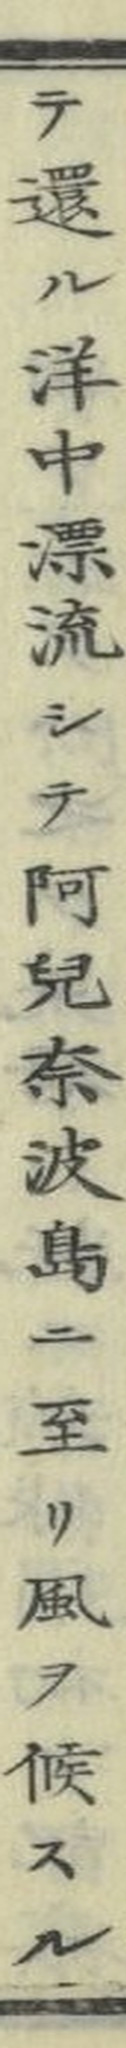テ還ル洋中漂流シテ阿兒奈波島ニ至リ風ヲ候スル
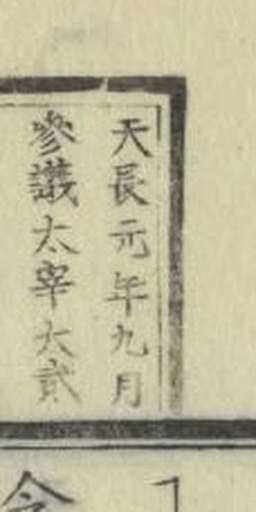天長元年九月
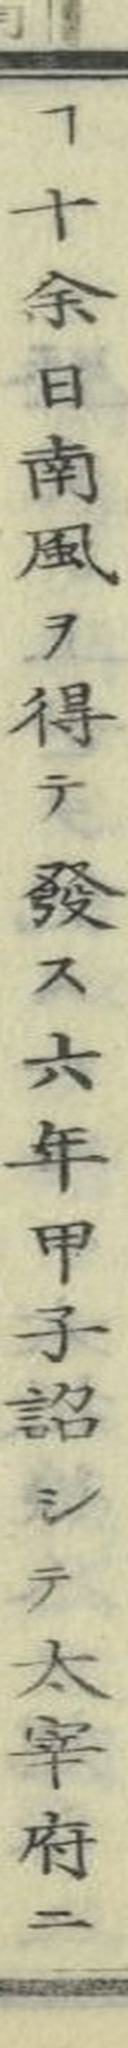コト十余日南風ヲ得テ發ス六年甲子詔シテ太太宰府ニ
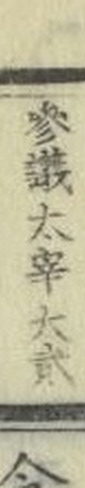參議太宰大貳
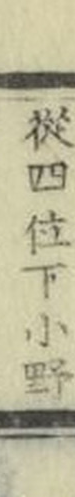從四位下小野
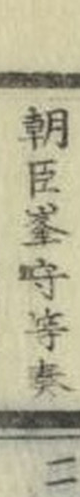朝臣峯守等奏
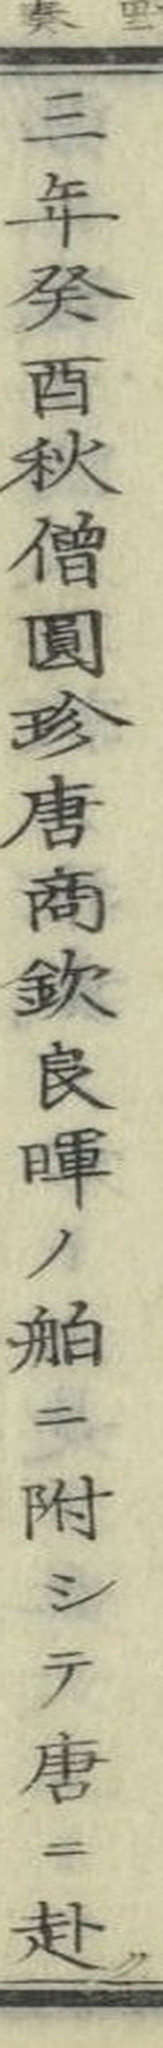三年癸酉秋僧圓珍唐商欽良暉ノ舶ニ附シテ唐ニ赴
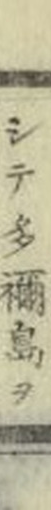シテ多禰島ヲ
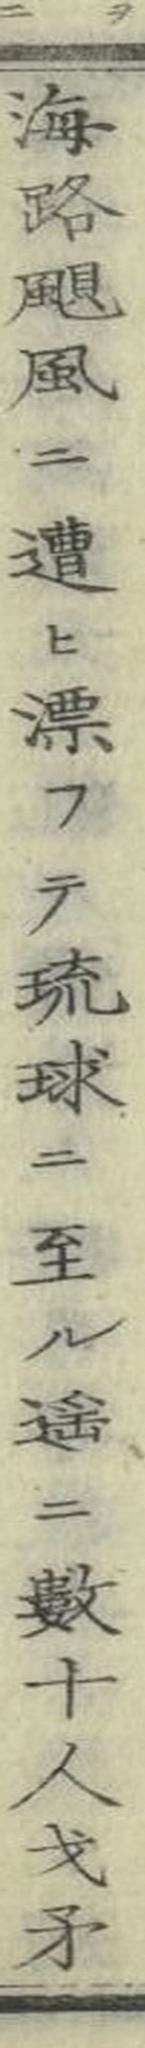海路颶風ニ遭ヒ漂フテ琉球ニ至ル遥ニ數十人戈矛
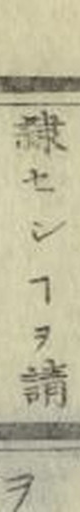隷センコトヲ請
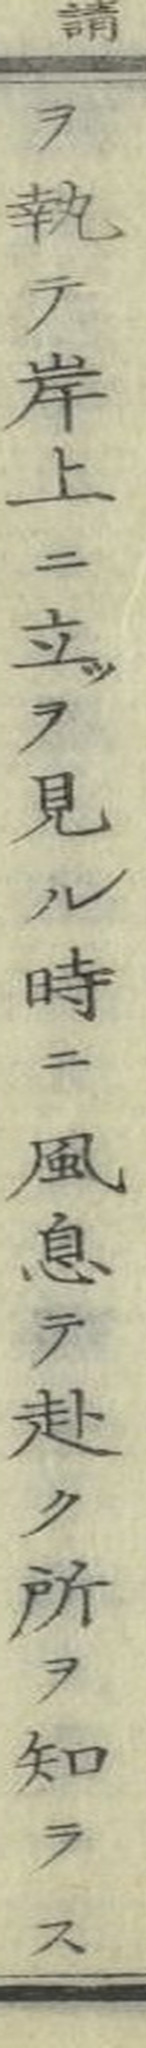ヲ執テ岸上ニ立ヲ見ル時ニ風息テ赴ク所ヲ知ラス
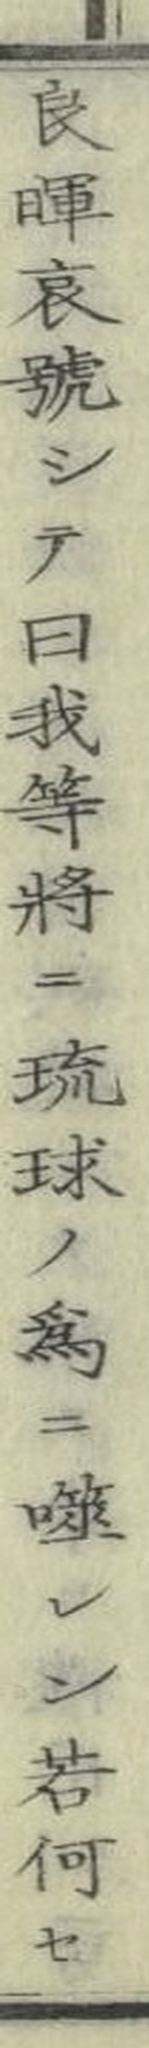良暉哀號シテ曰我等將ニ琉球ノ爲ニ噬レン若何セ
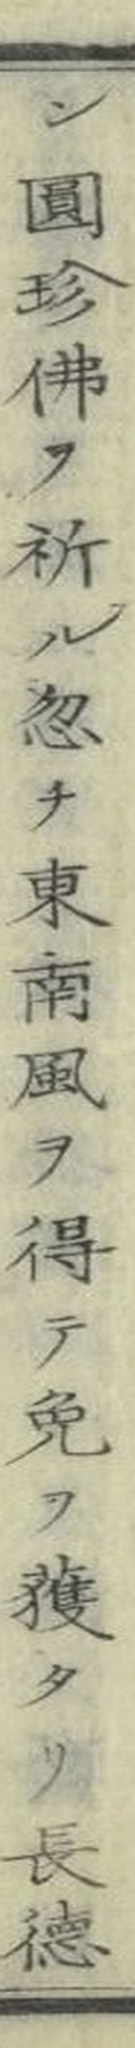ン圓珍佛ヲ祈ル忽シ東南風ヲ得テ免ヲ獲タリ長德
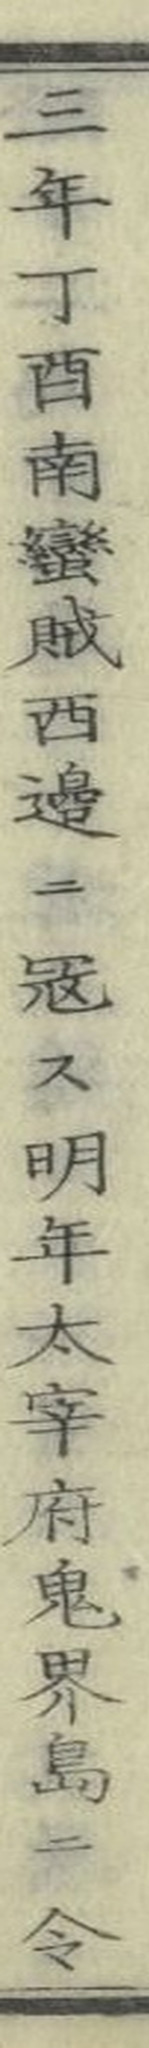三年丁酉南蠻賊西邉ニ冠ス明年太宰府鬼界島ニ令
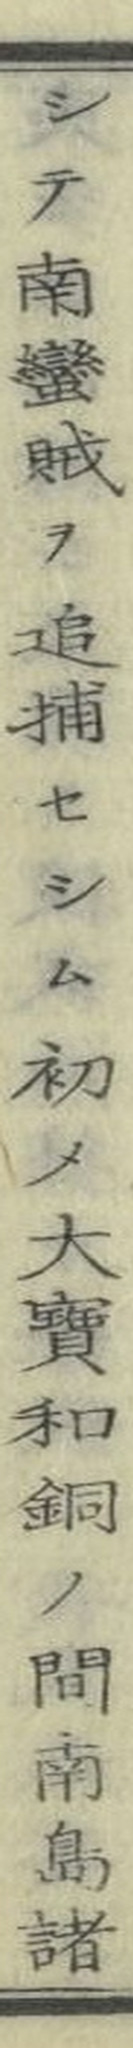シテ南蠻賊ヲ追捕セシム初メ大寶和銅ノ間南島諸

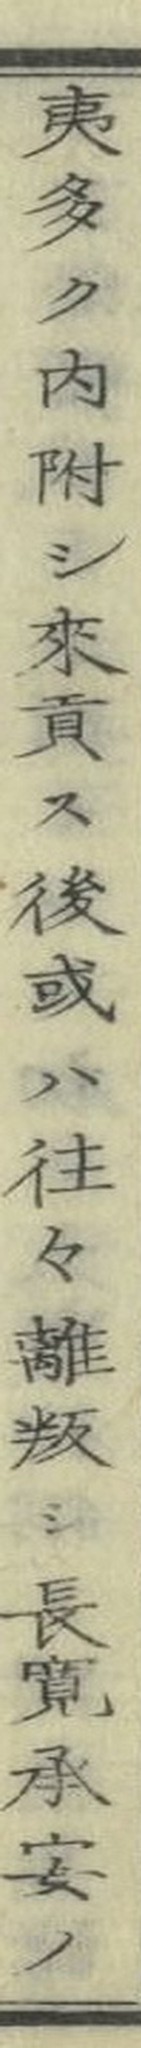夷多ク內附シ來貢ス後或ハ往々離叛シ長寛承安ノ
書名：琉球藩史 一之巻
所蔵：University of the Ryukyus Library
